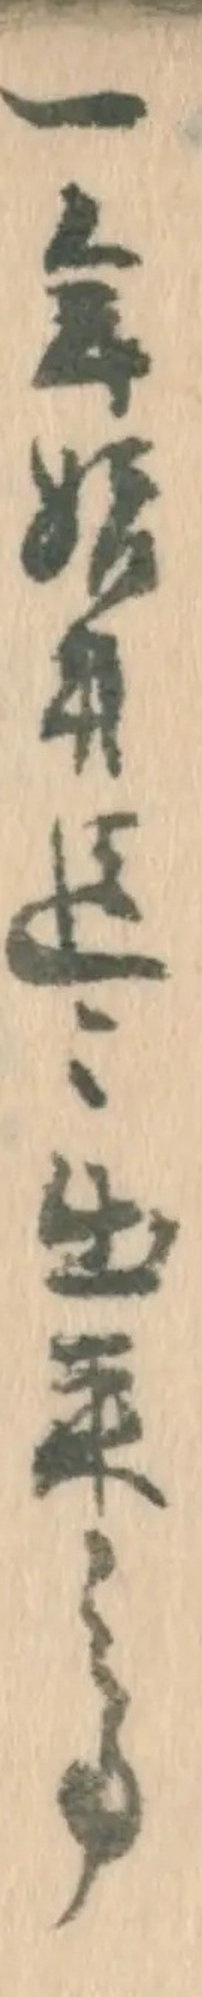一年始用追々出来候事
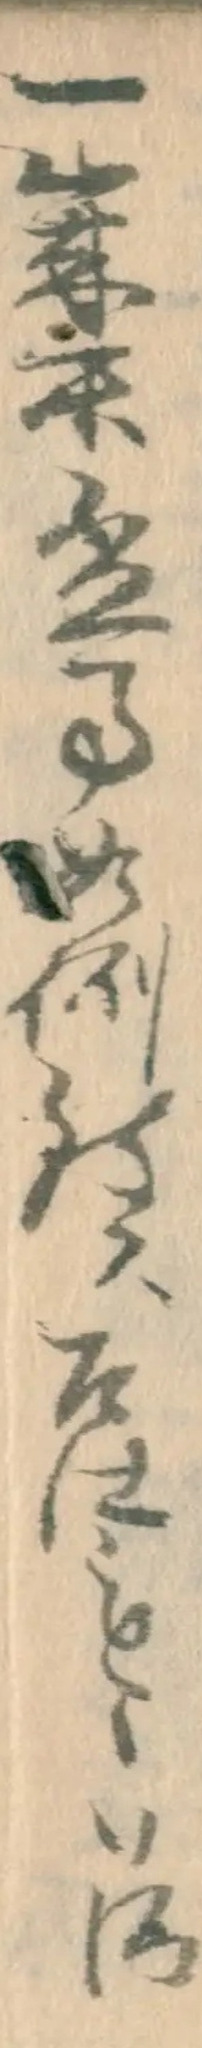一歳末盃事如例致ス召仕ともへ御酒
